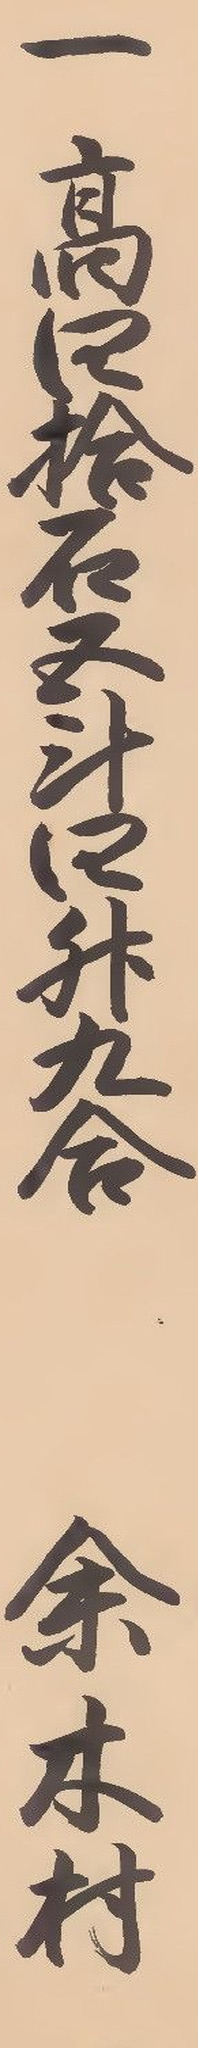一高四拾石五斗四升九合余木村
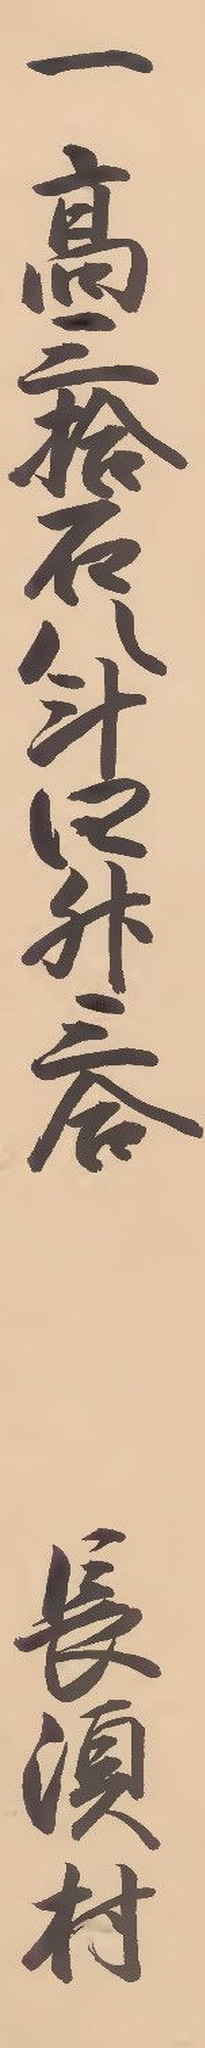一高三拾石八斗四升三合長須村

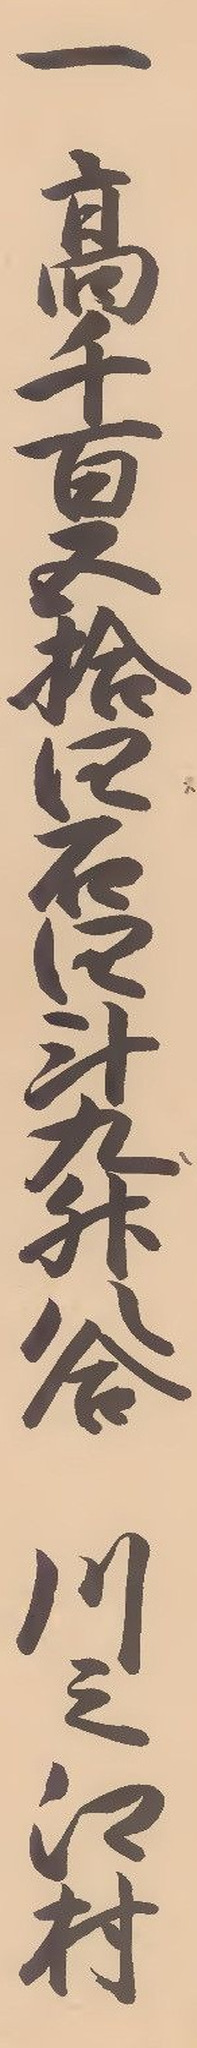一高千百五拾四石四斗九升八合川之江村
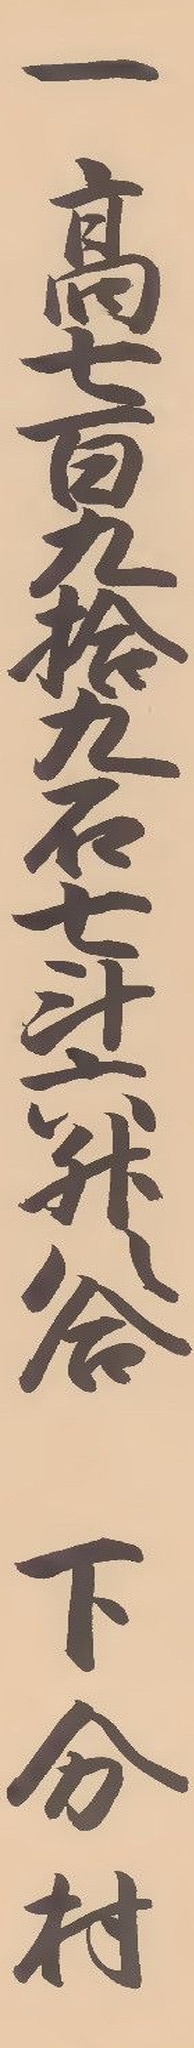一高七百九拾九石七斗六升八合下分村
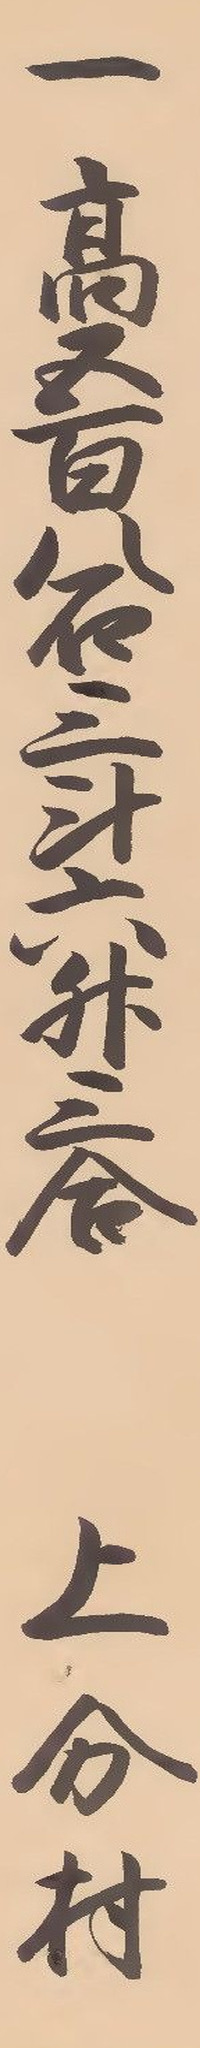一高五百八石三斗六升三合上分村
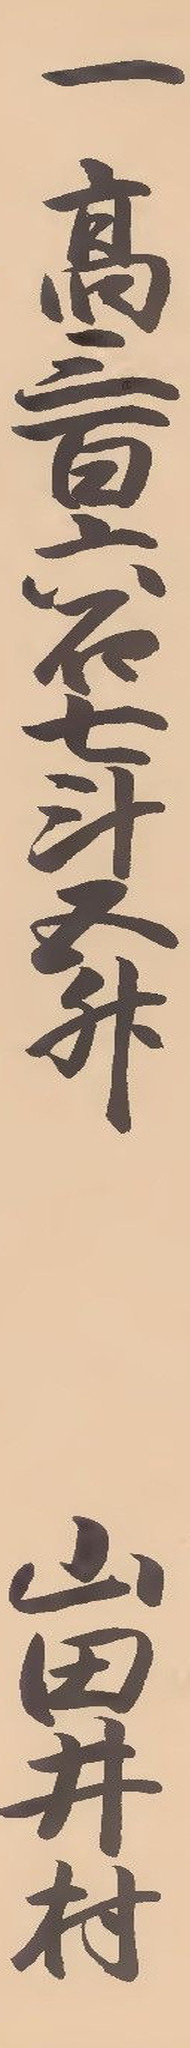一高三百六石七斗五升山田井村
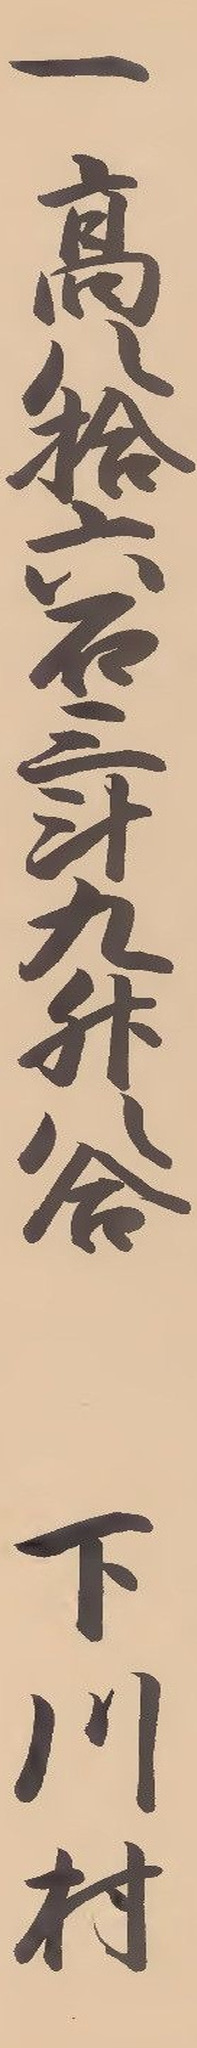一高八拾六石三斗九升八合下川村
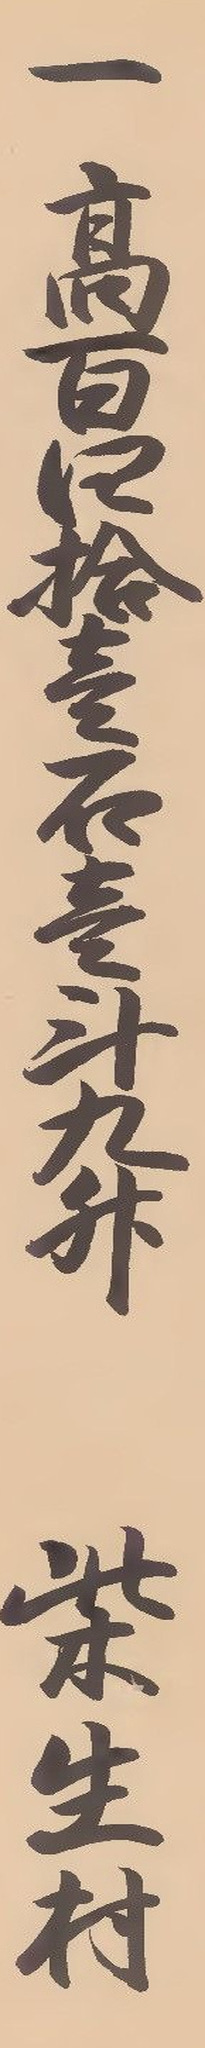一高百四拾壱石壱斗九升柴生村
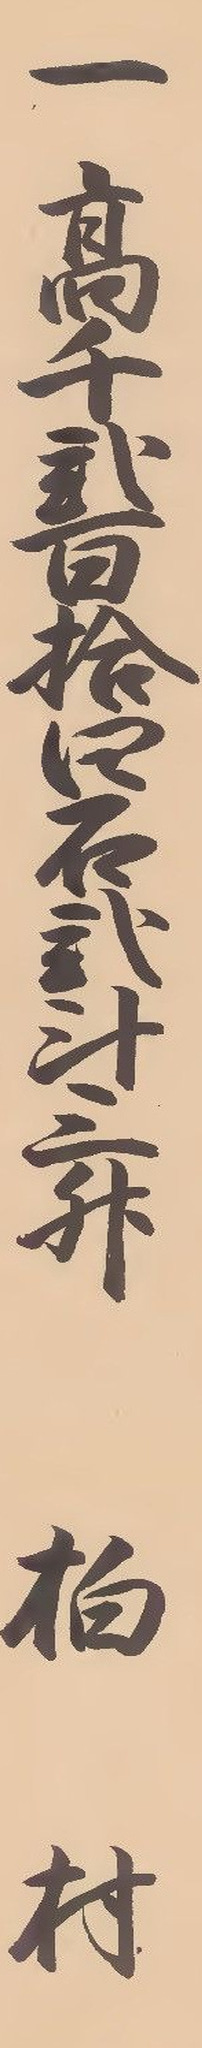一高千弐百拾四石弐斗三升柏村
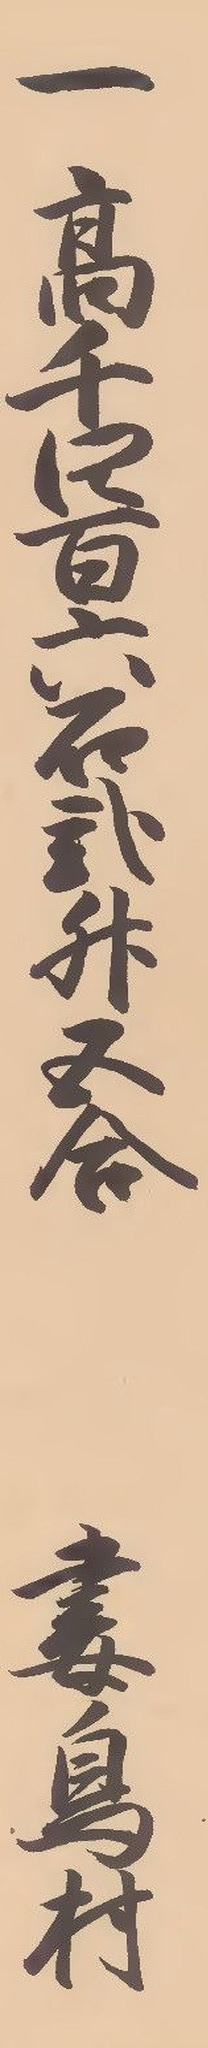一高千四百六石弐升五合妻鳥村

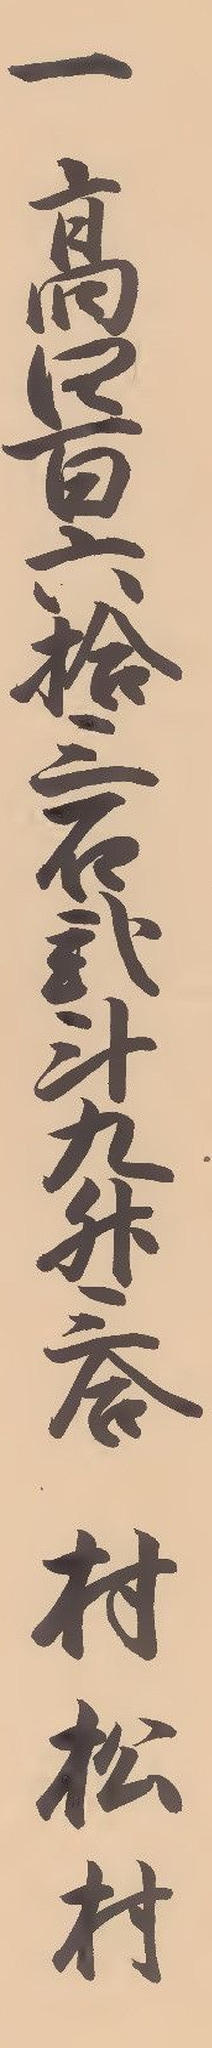一高四百六拾三石弐斗九升三合村松村
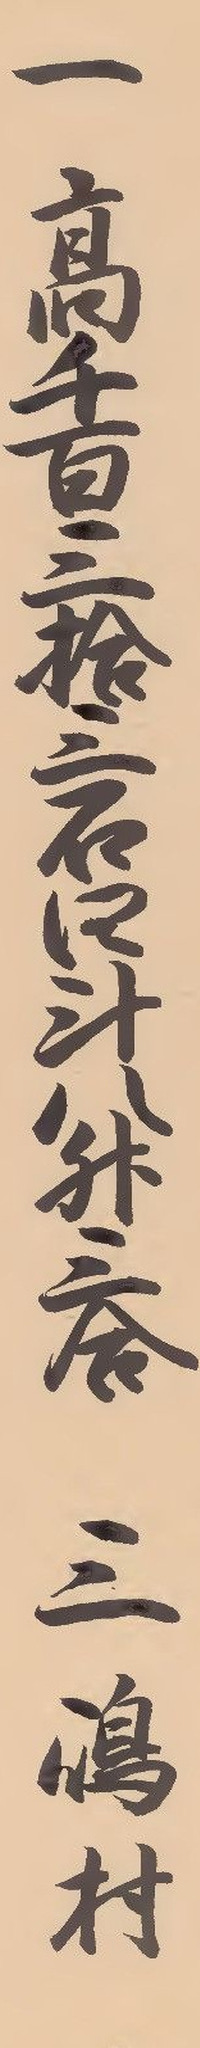一高千百三拾三石四斗八升三合三島村
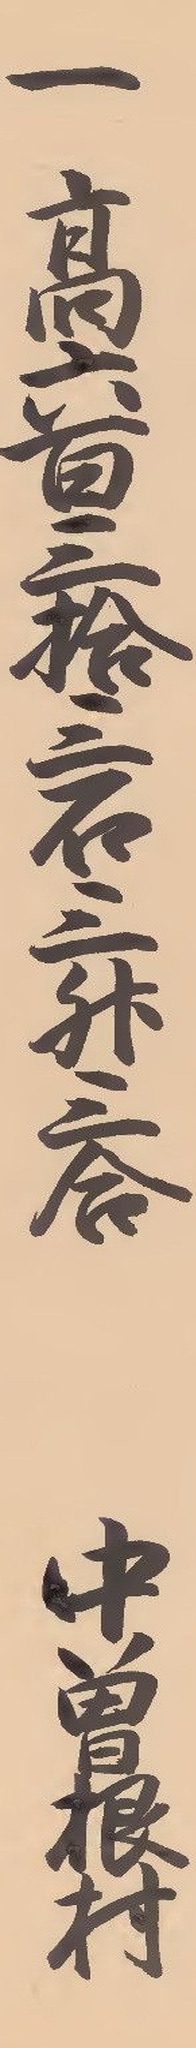一高六百三拾三石三升三合中曽根村
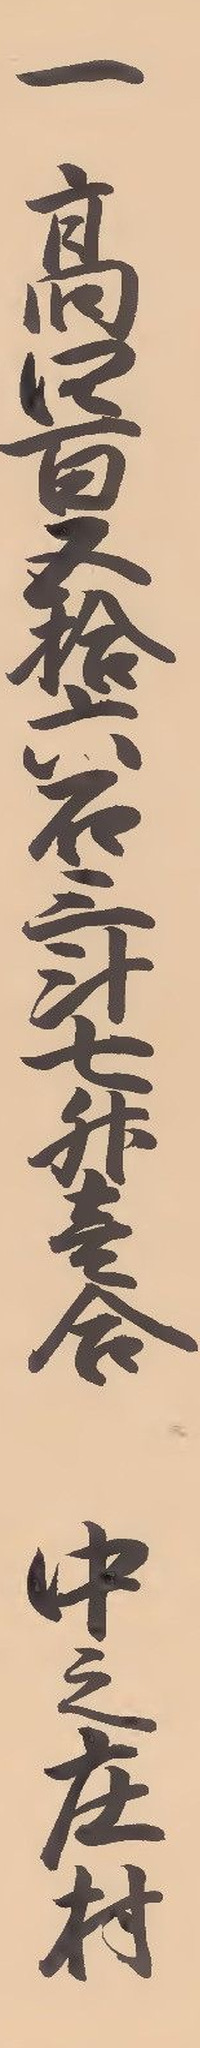一高四百五拾六石三斗七升壱合中之庄村
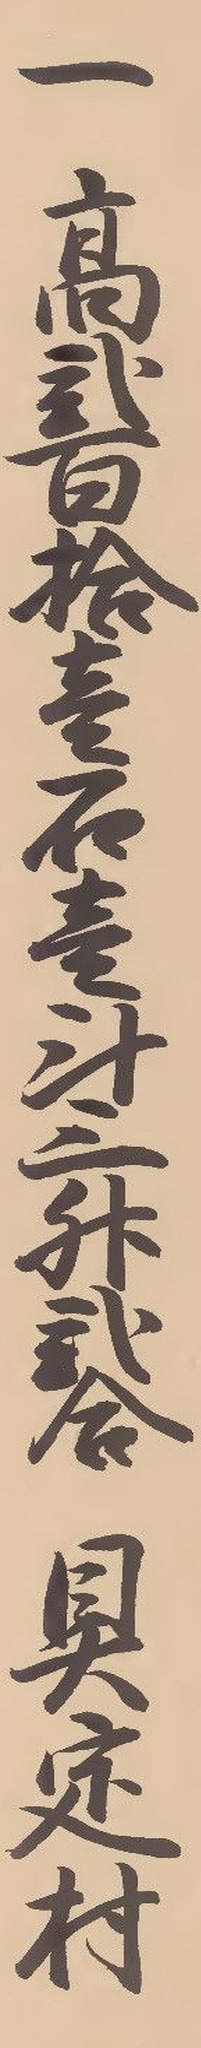一高弐百拾壱石壱斗三升弐合具定村
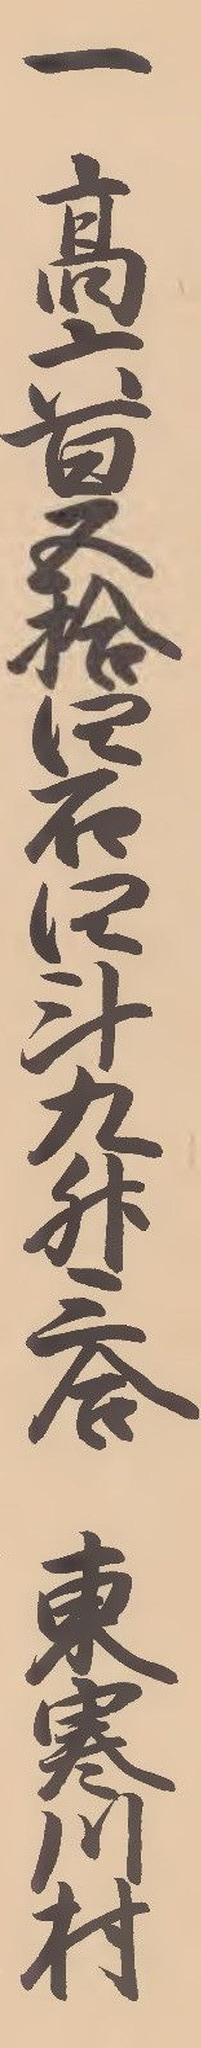一高六百五拾四石四斗九升三合東寒川村
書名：伊予国郷帳
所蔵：国立公文書館 National Archives of Japan
